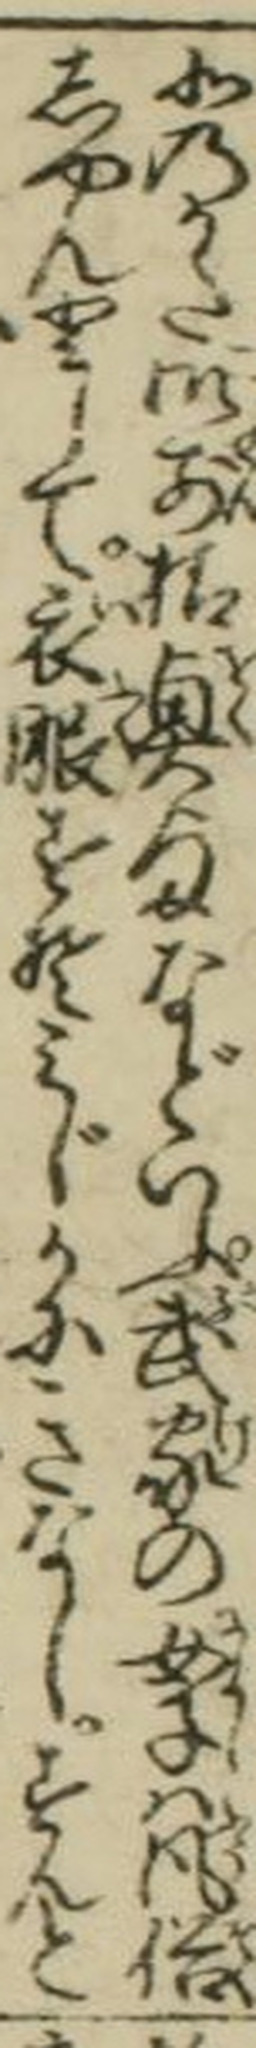しやんとして。衣服すそみじかにきなし。すんと
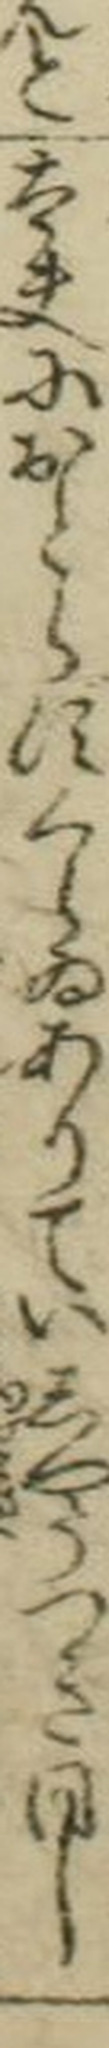太夫におとらずくらゐありていしやうつき同し
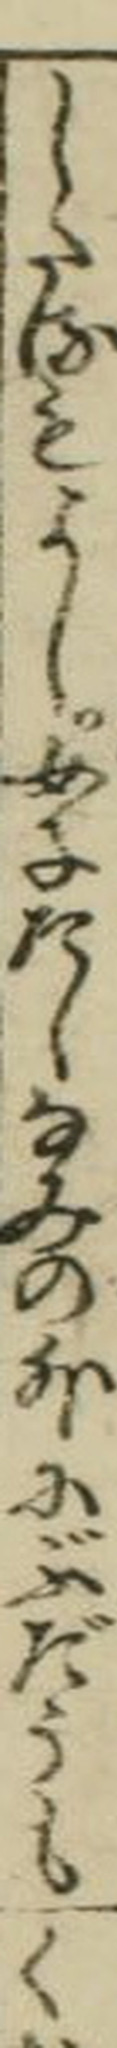したるもよし。女子たしなみの外にぶだうも
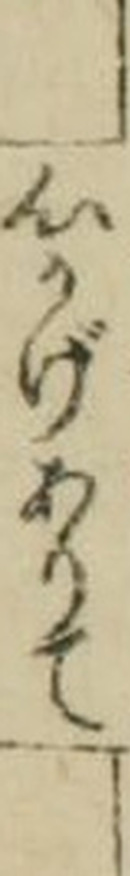心かげありて
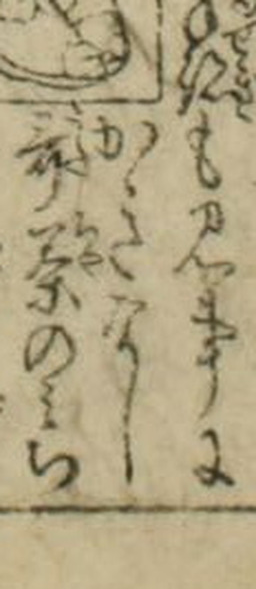かきなし
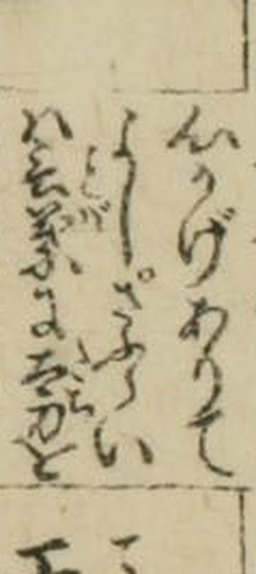よし。さふらい
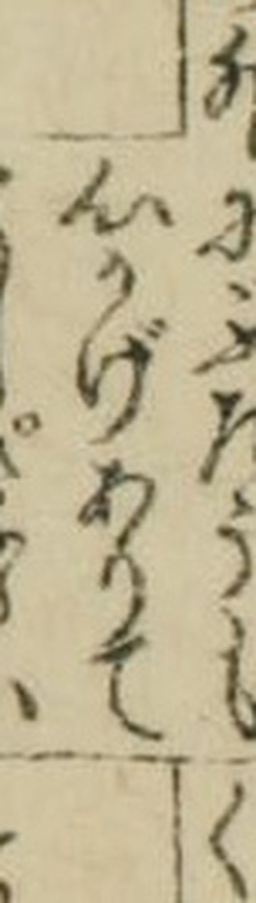よし。さふらい
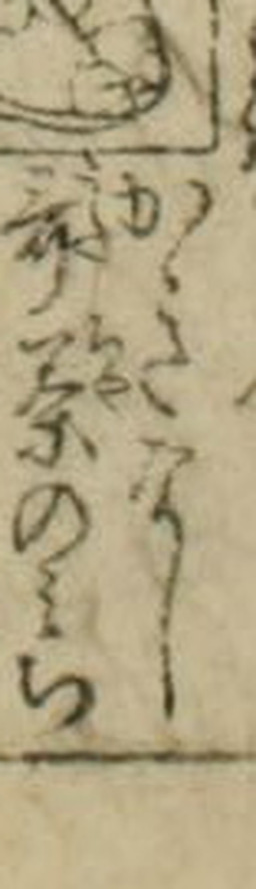哥茶のみち
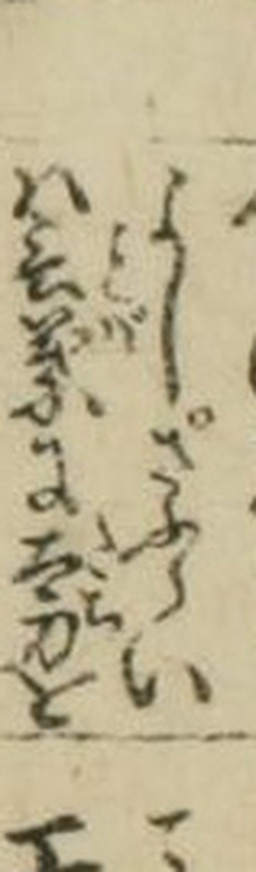は言葉に太刀を
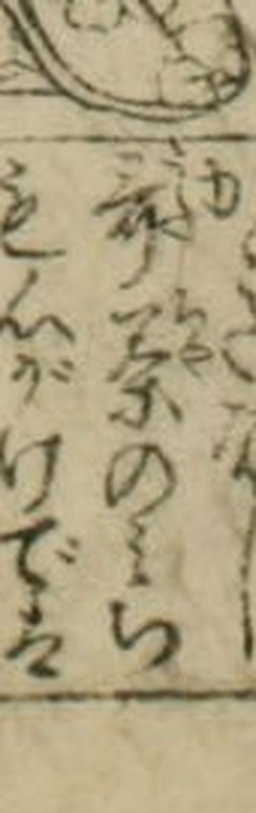を心がけでは
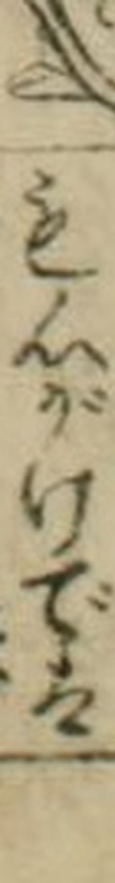を心がけでは
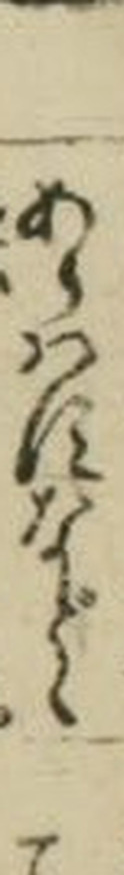あらはすなどゝ
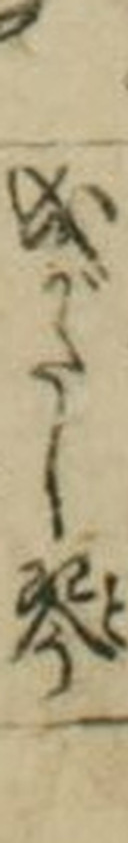成がたし琴
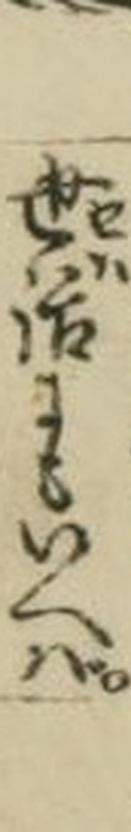世話にもいへば。
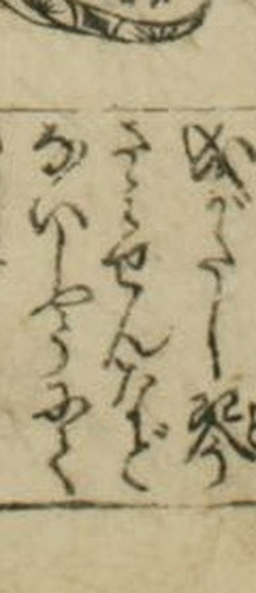さみせんなど
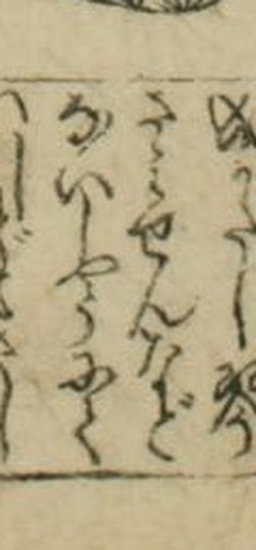さみせんなど
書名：女源氏教訓鑑
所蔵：東京学芸大学附属図書館
